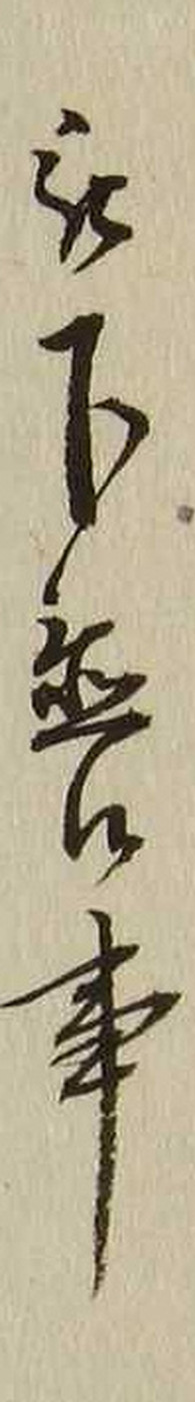被下置候事
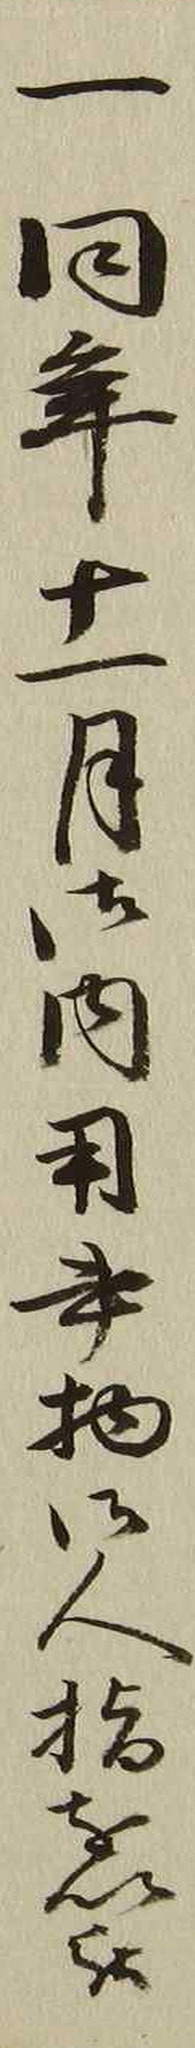一同年十一月御内用書物御人指を以被
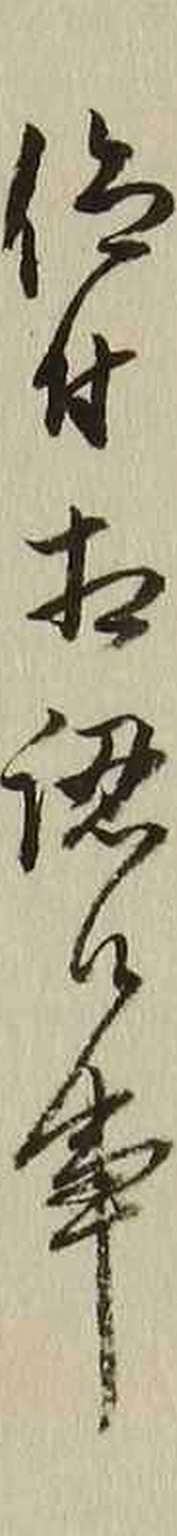仰付相認候事
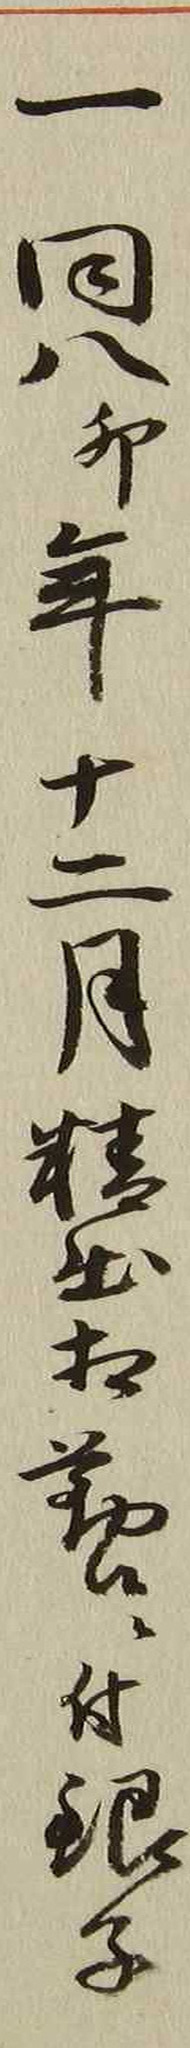一同八卯年十二月精出相勤候ニ付銀子
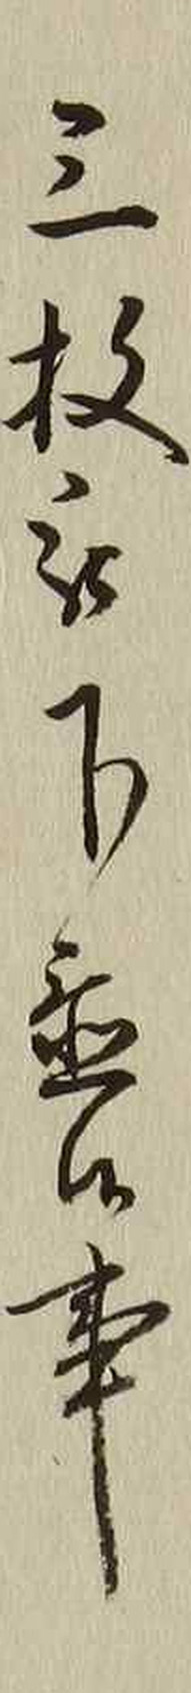三枚被下置候事
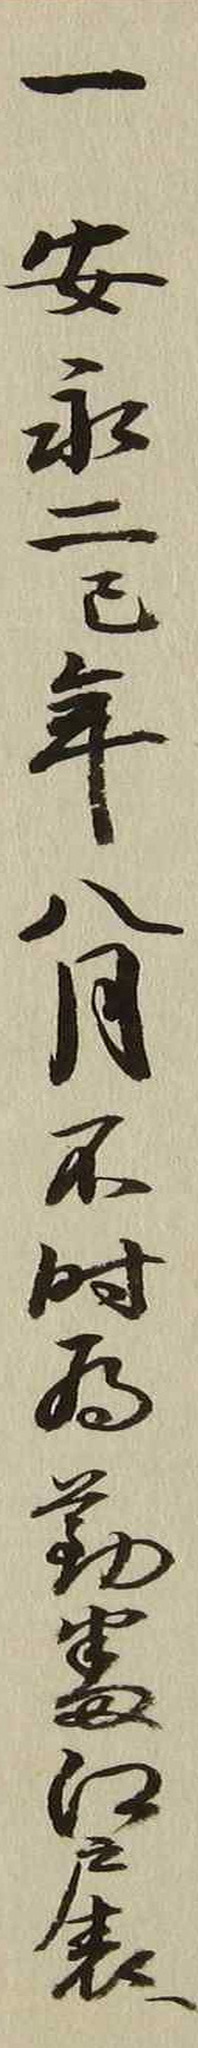一安永二巳年八月不時為勤番江戸表へ
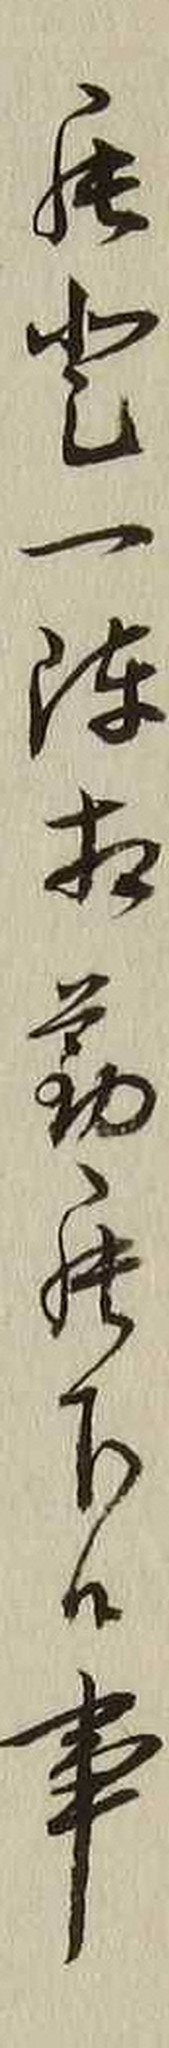罷登一陣相勤罷下候事
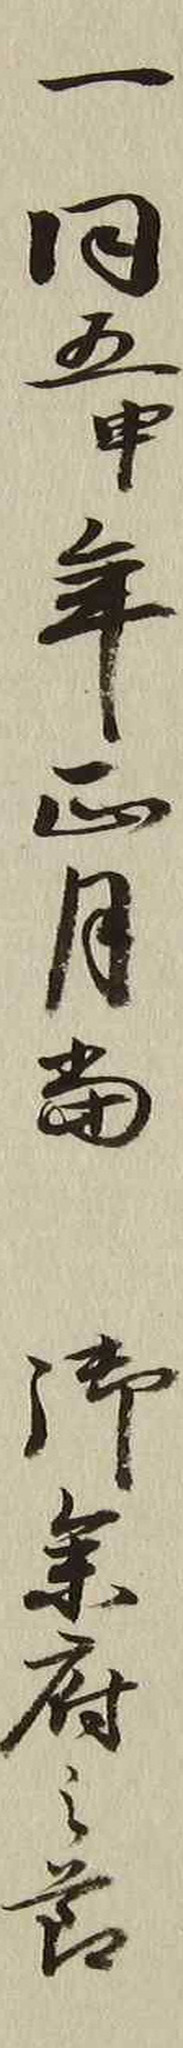一同五申年正月当御参府之節
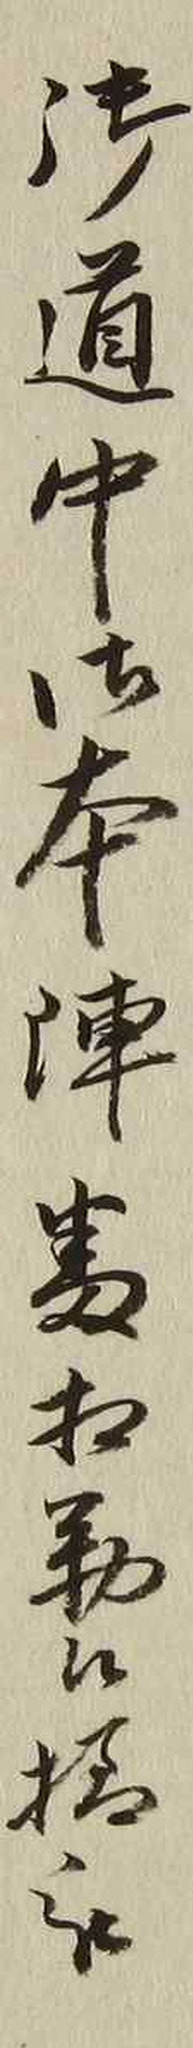御道中御本陣番相勤候様被
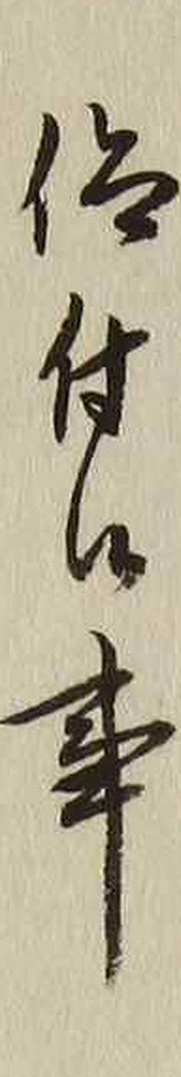仰付候事
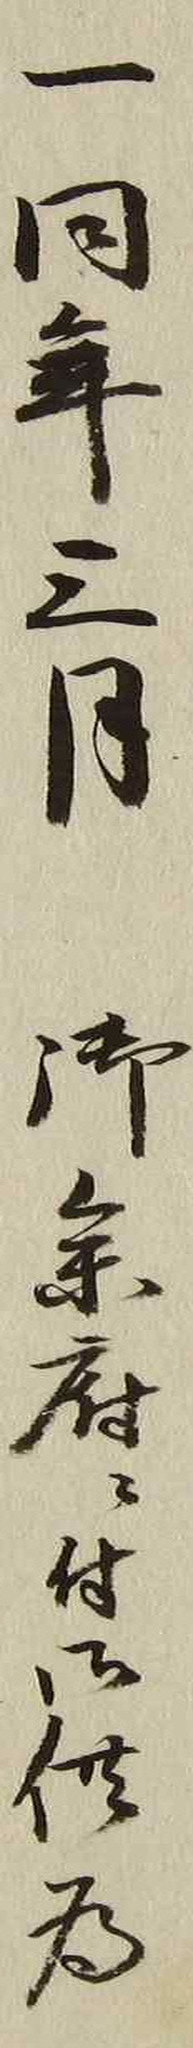一同年三月御参府ニ付御供為
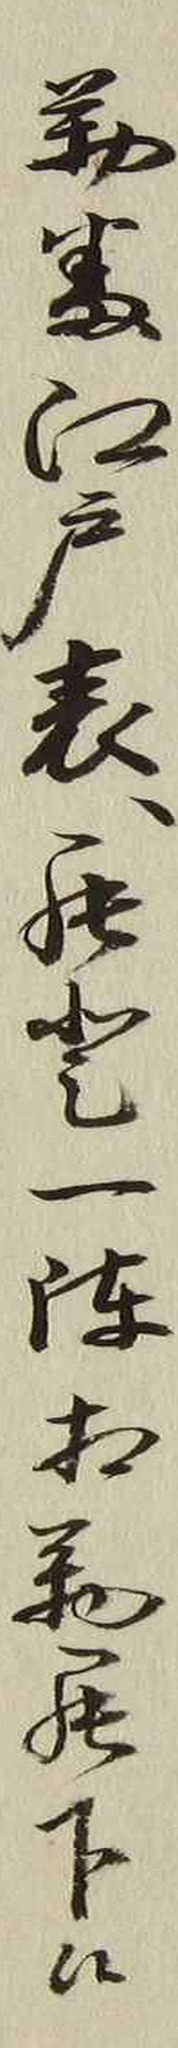勤番江戸表へ罷登一陣相勤罷下候
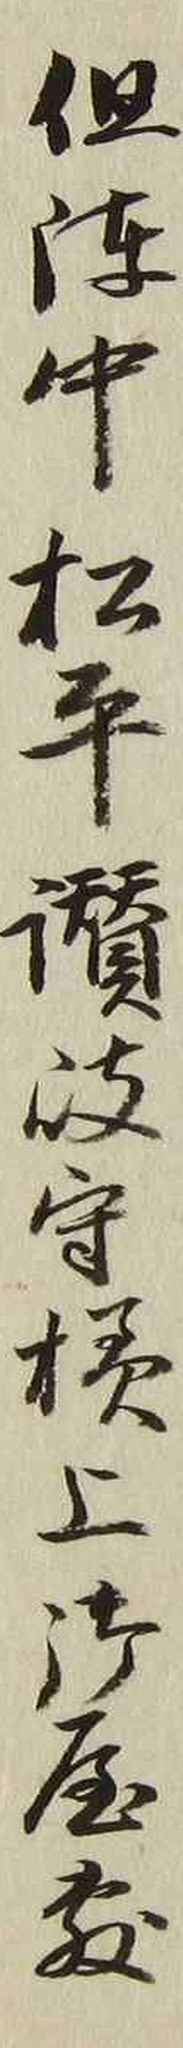但陣中松平讃岐守様上御屋敷
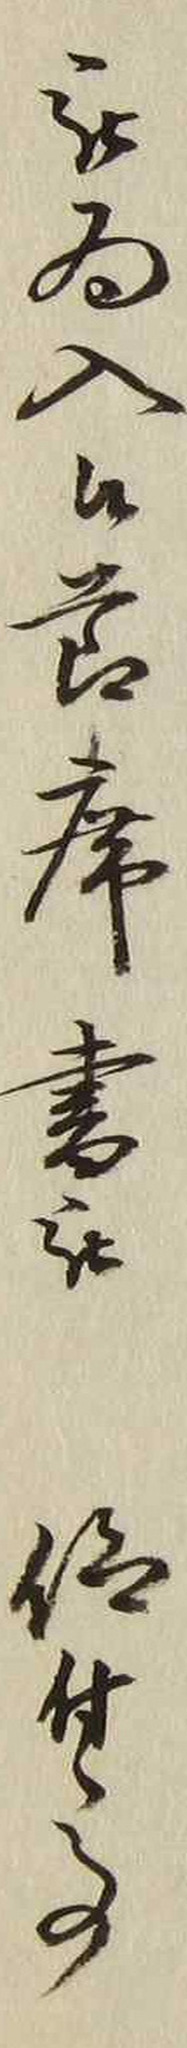被為入候節席書被仰付候事
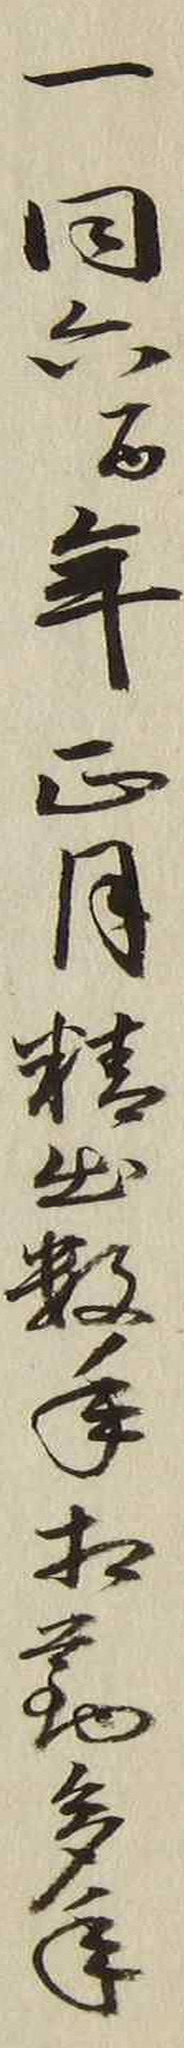一同六酉年正月精出数年相勤多年
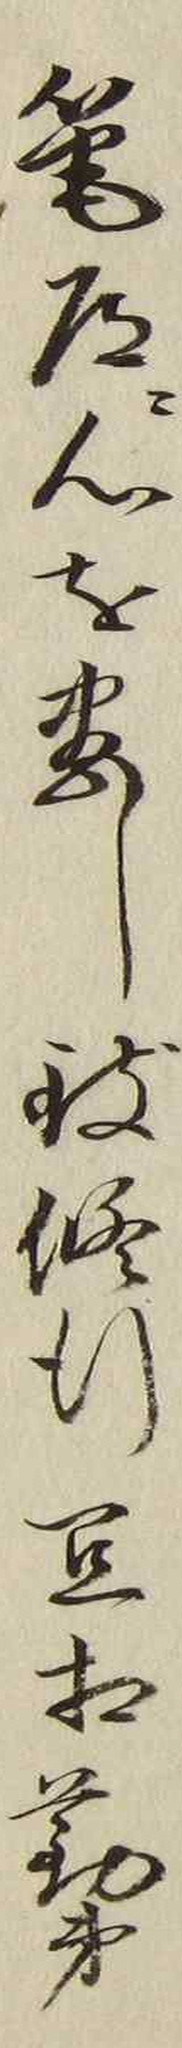筆道ニ心を尽し致修行宜相勤弟
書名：諸士系譜　巻之61　と之部4
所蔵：会津若松市立会津図書館
